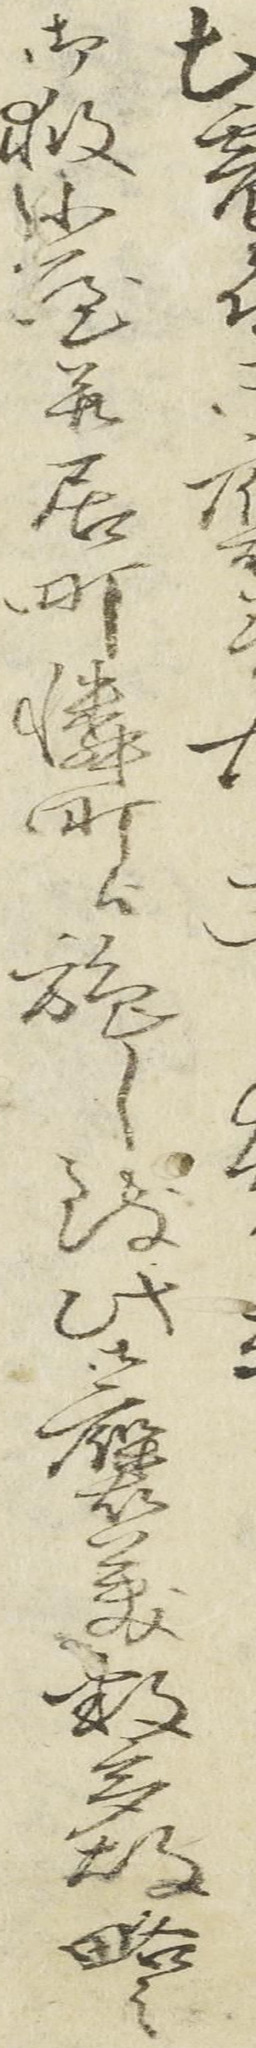御救小屋幷居町隣町え施し致此御褒美数多故略之
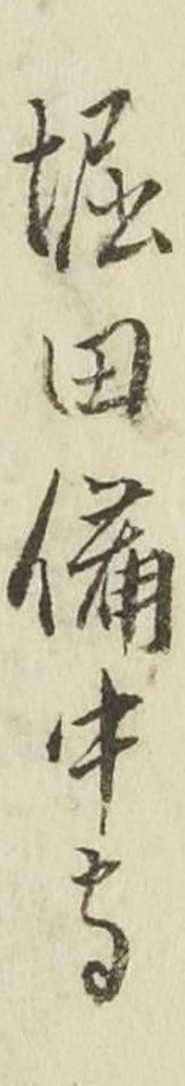堀田備中守
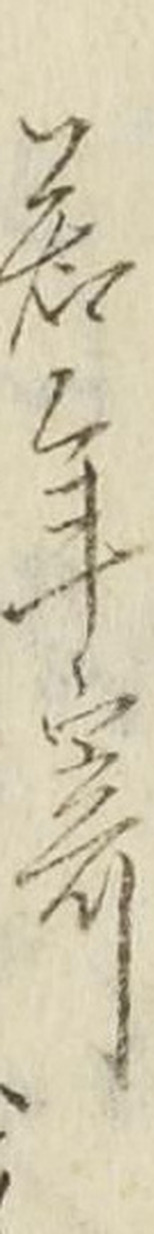若年寄
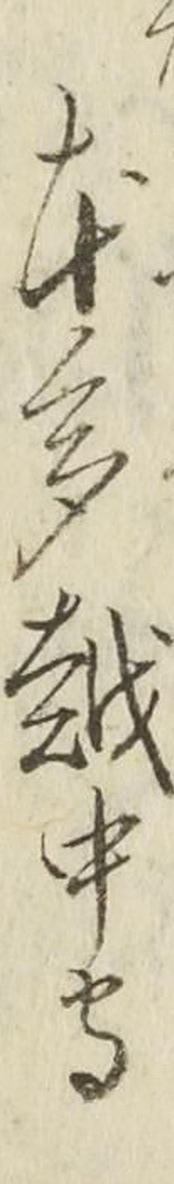本多越中守
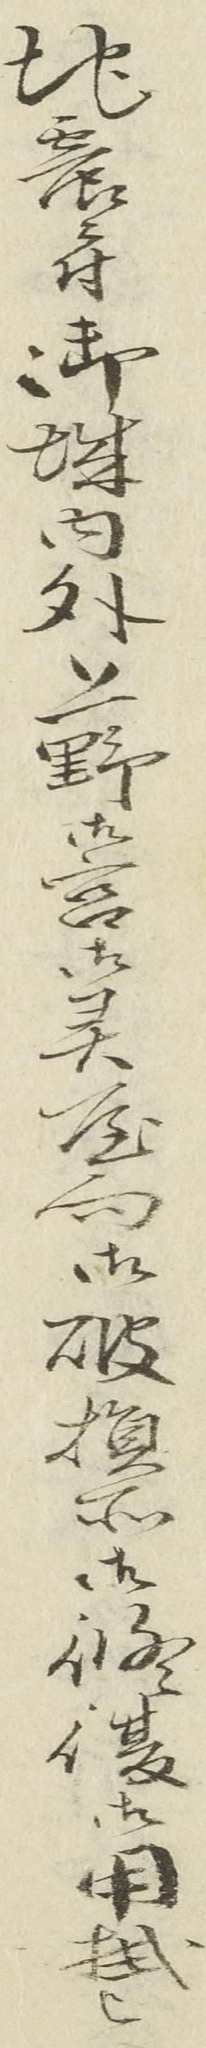地震ニ付御城内外上野御宮御霊屋向御破損所御修復御用掛被
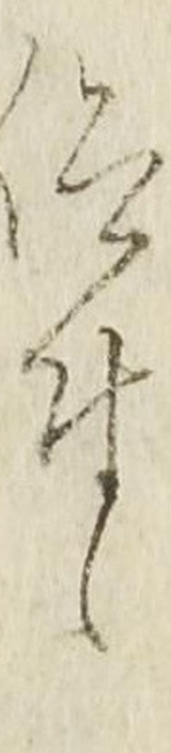仰付候
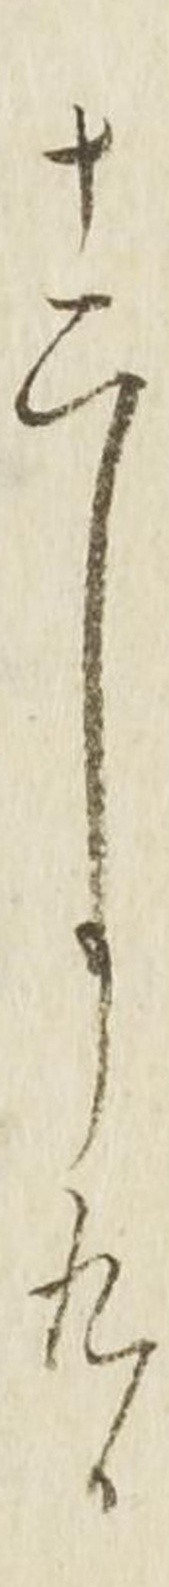十二月九日
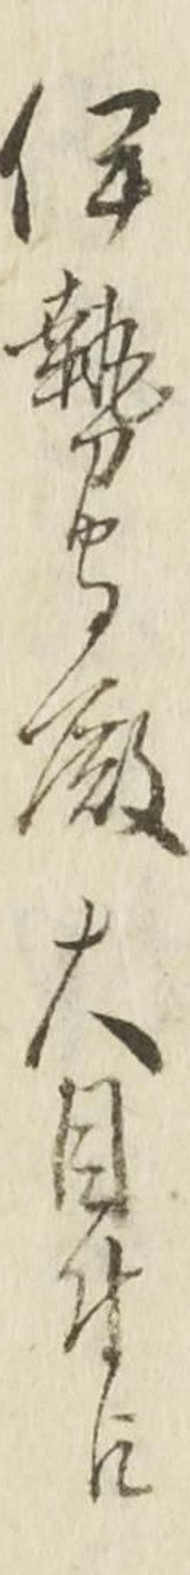伊勢守殿大目付え
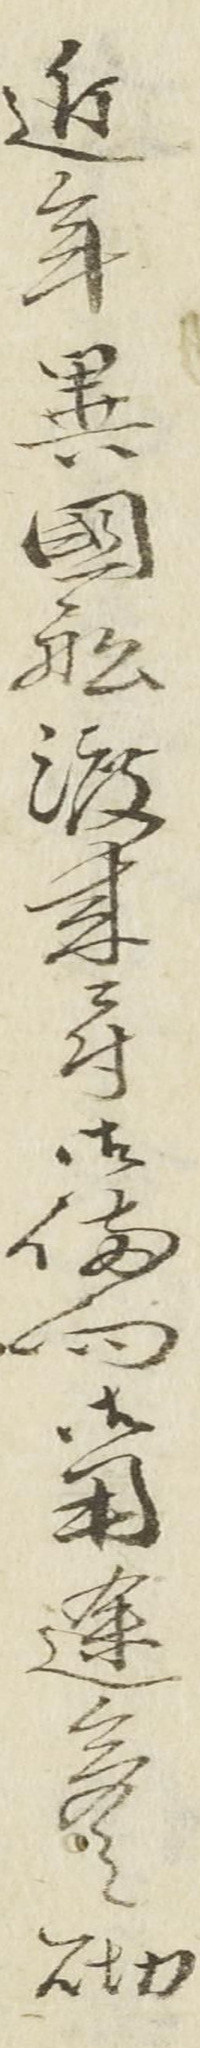近年異国舩渡来ニ付御備向御用途多之砌
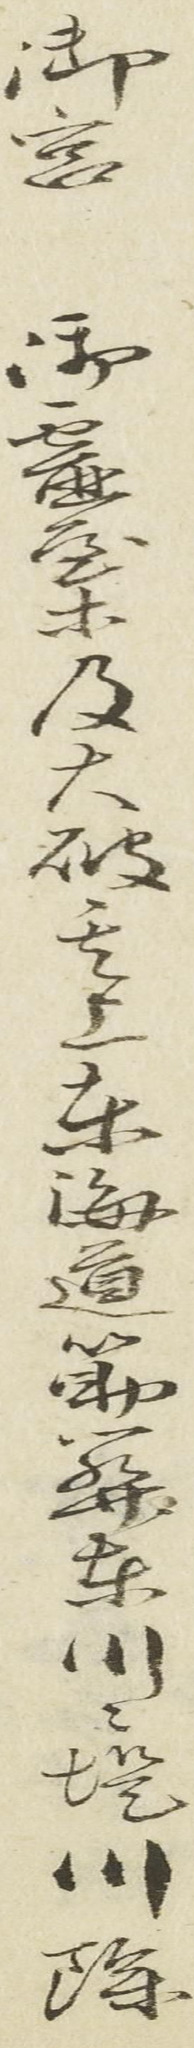御宮御霊屋等及大破其上東海道筋関東川々堤川除
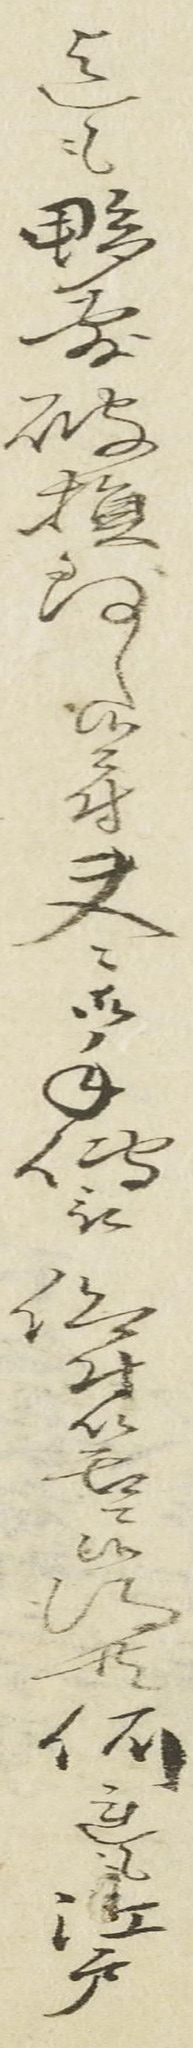迄も夥敷破損致し候ニ付夫々御手傳被仰付筈ニ候得共何れも江戸
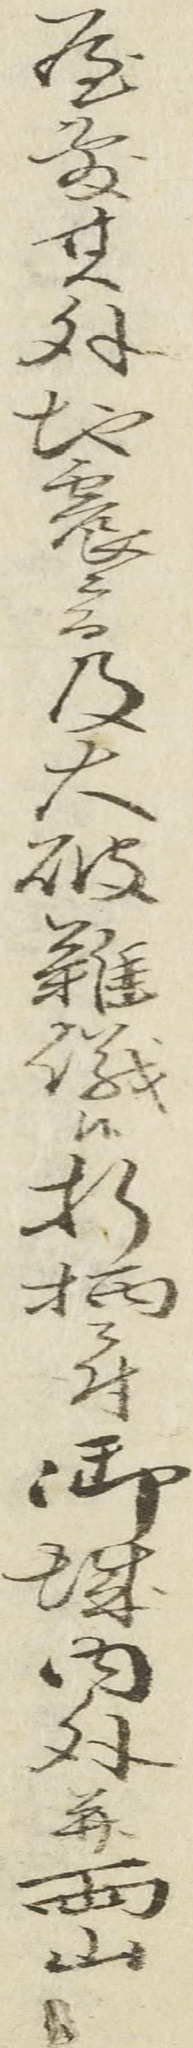屋敷其外地震ニ而及大破難儀候折柄ニ付御城内外並両山
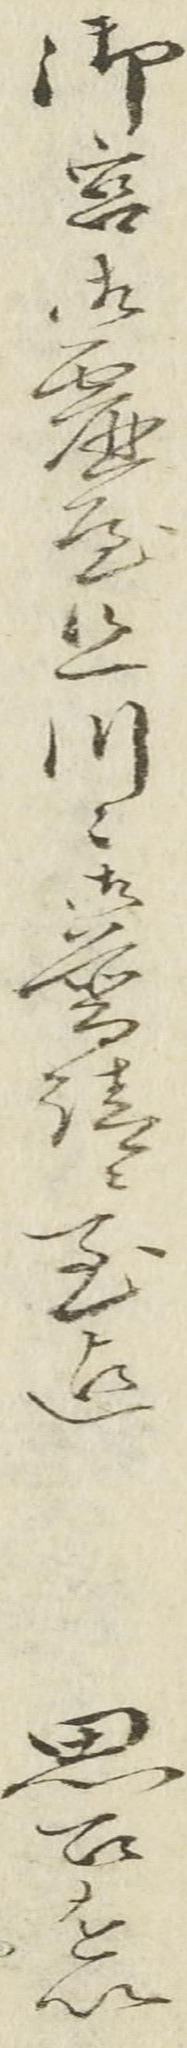御宮御霊屋旦川々御普請ニ至迄思召を以
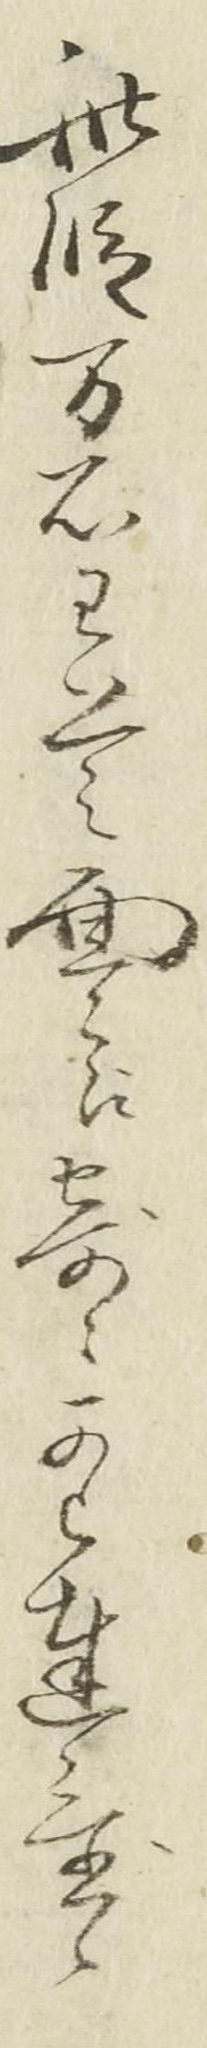此段万石已上之面々え寄々可被達置候
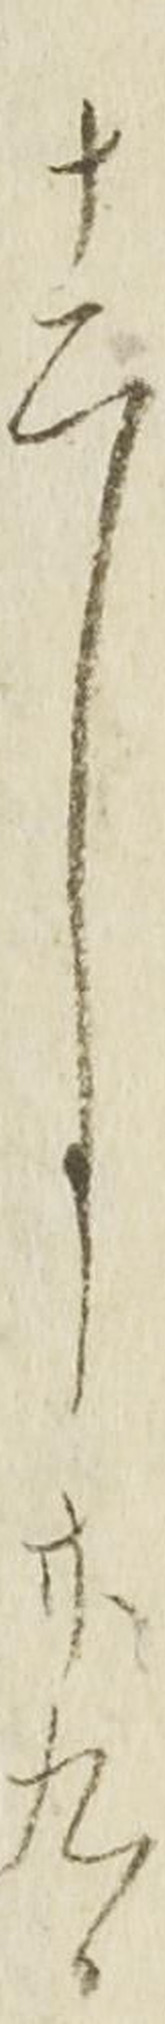十二月九日
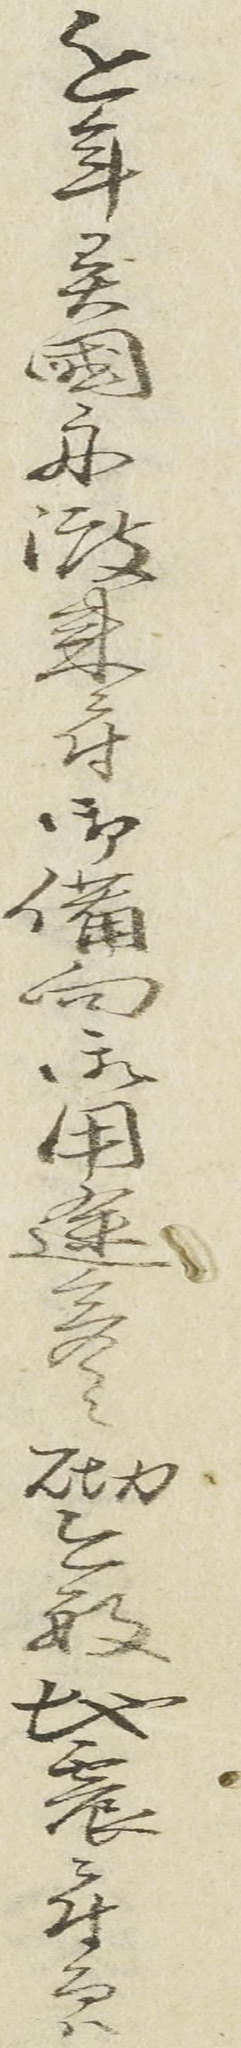近年異国船渡来ニ付御備向御用途多之砌今般地震ニ付而ハ
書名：安政二乙卯年十月二日大地震之事
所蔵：東京大学地震研究所図書室 Earthquake Research Institute Library, The University of Tokyo, JAPAN
